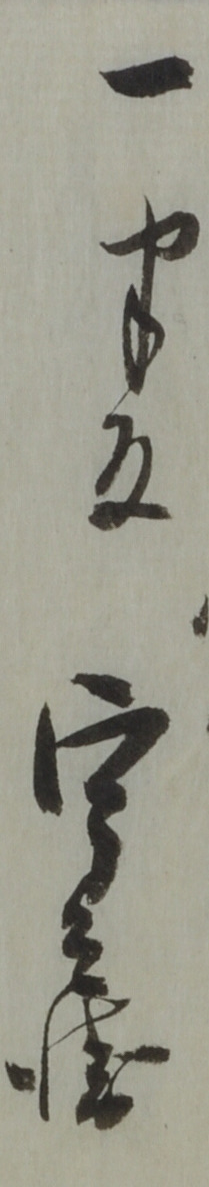一半反宇兵衛
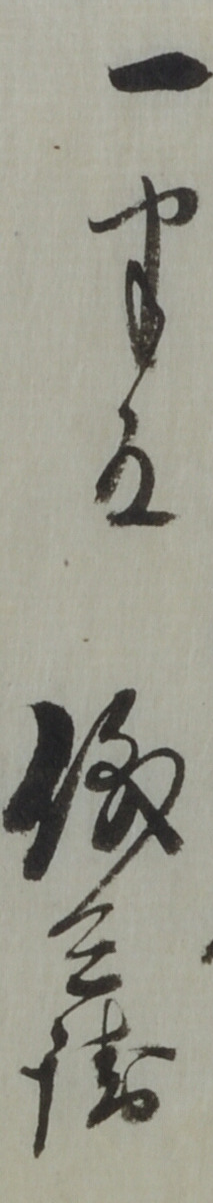一半反儀兵衛

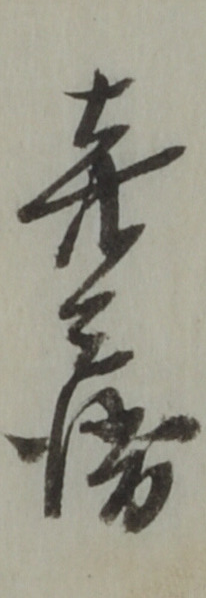利兵衛
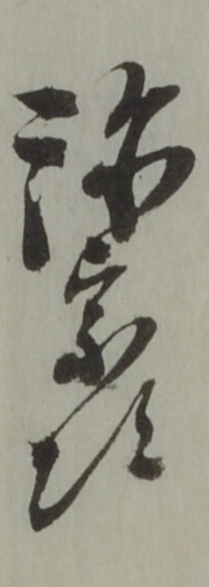弥宗治
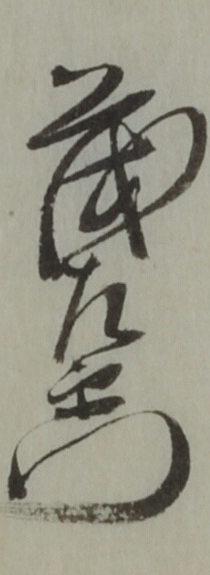茂左衛門
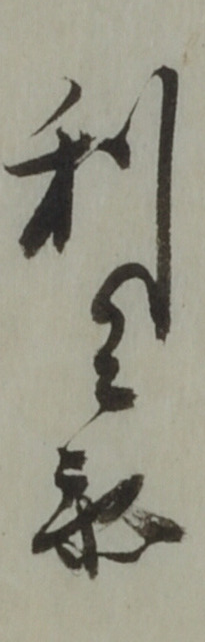利兵衛
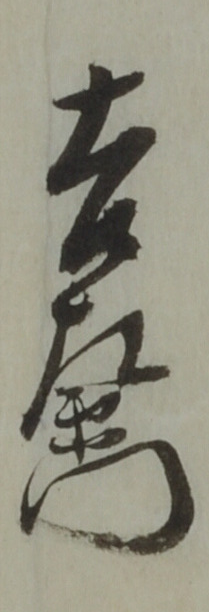吉左衛門
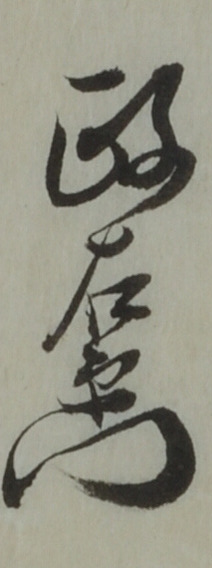政右衛門
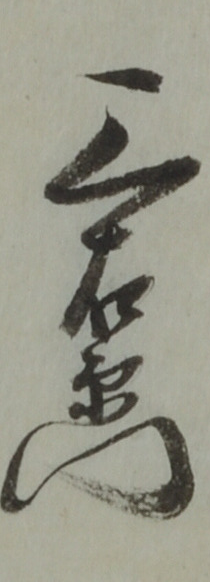三右衛門
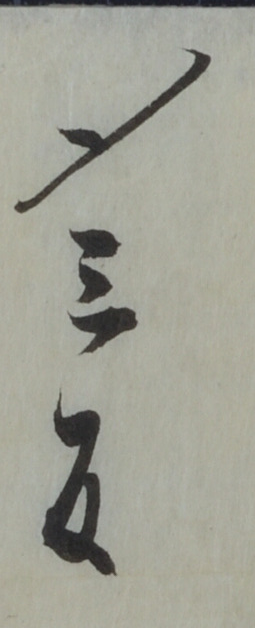〆三反

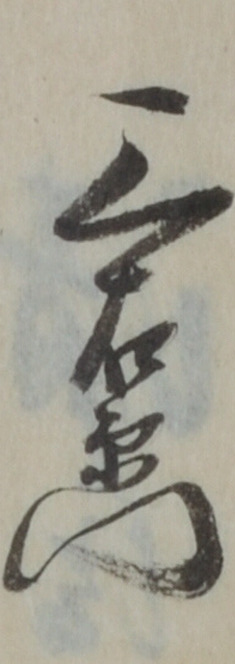七右衛門
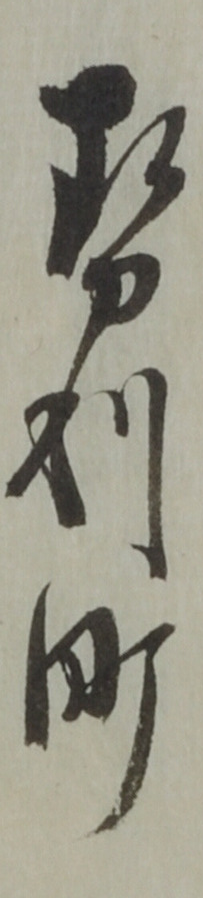勢利町
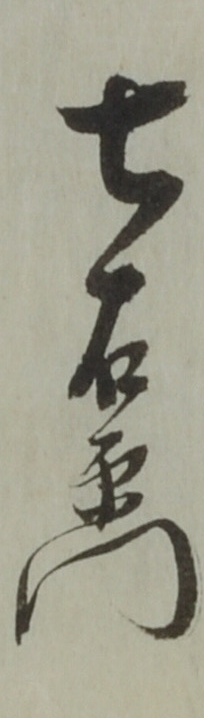七右衛門
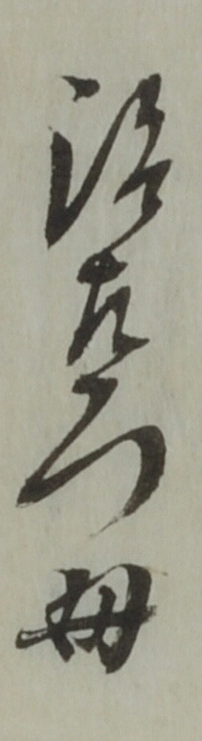治右衛門母
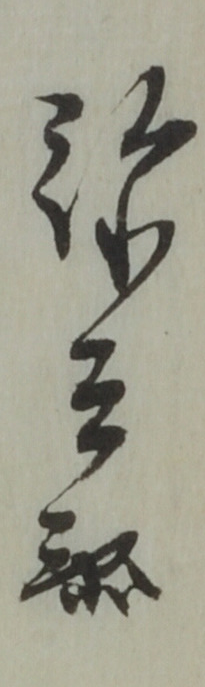弥兵衛
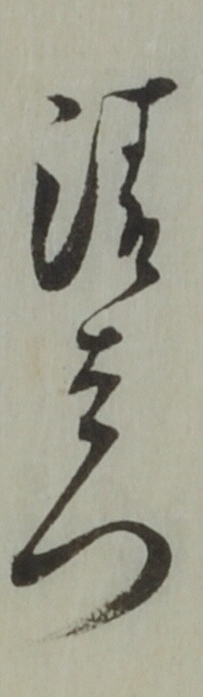清右衛門
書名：融通割合帳
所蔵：伊那市立高遠町図書館・合同会社AMANE
